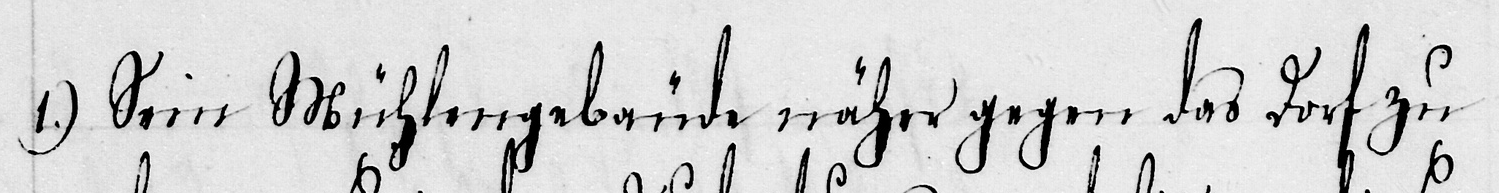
1.) Sein Mühlengebäude näher gegen das Dorf zu
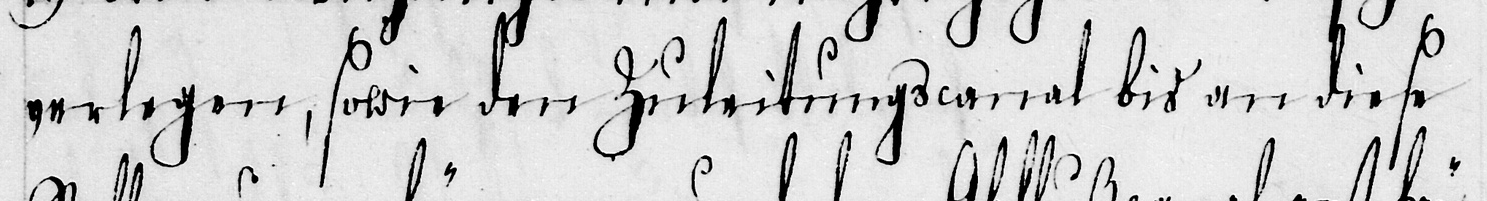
verlegen, sowie den Zuleitungscanal bis an diese
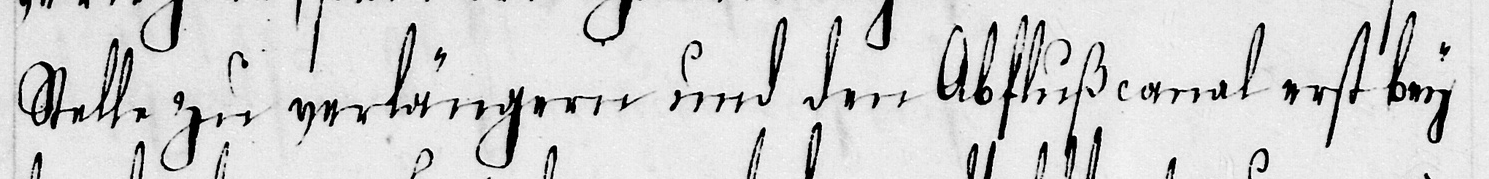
Stelle zu verlängern und den Abflußcanal erst bey
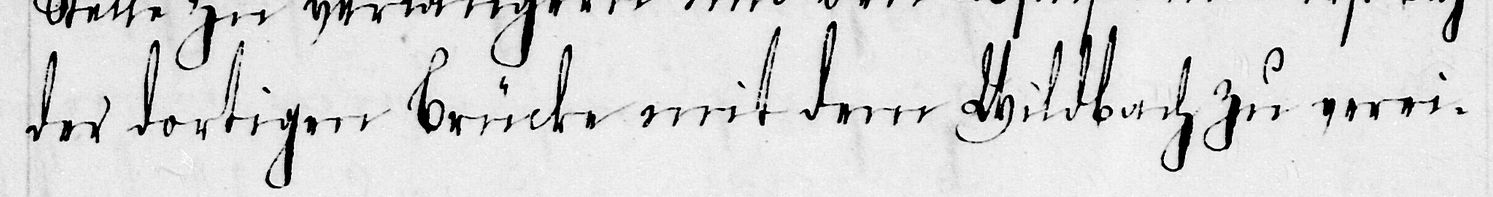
der dortigen Brücke mit dem Wildbach zu verei¬
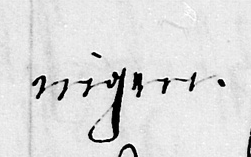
nigen.
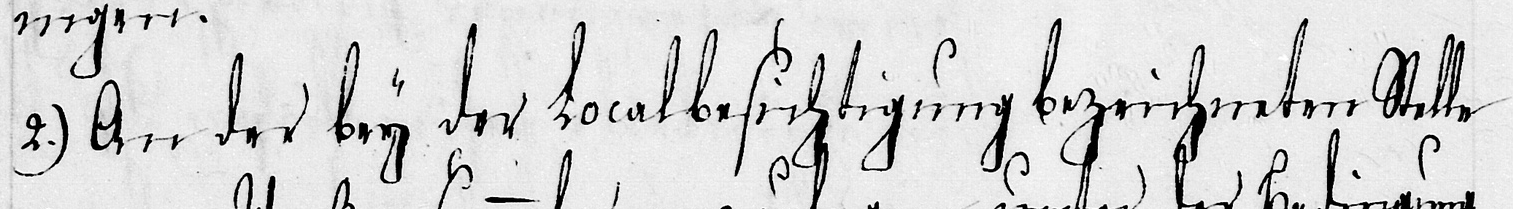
2.) An der bey der Localbesichtigung bezeichneten Stel¬
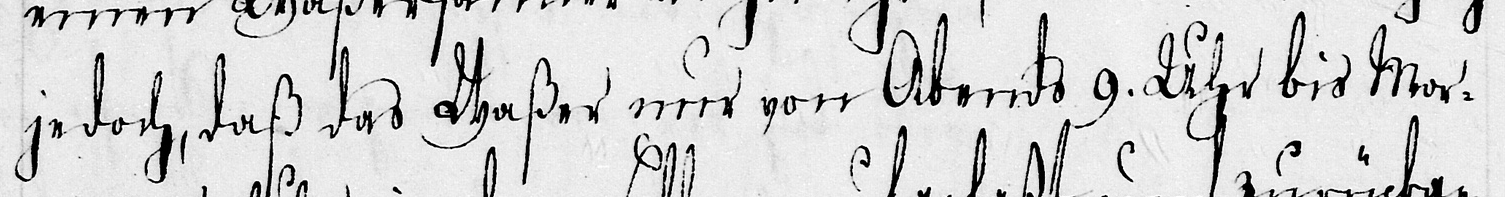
jedoch, daß das Waßer nur von Abends 9. Uhr bis Mor¬
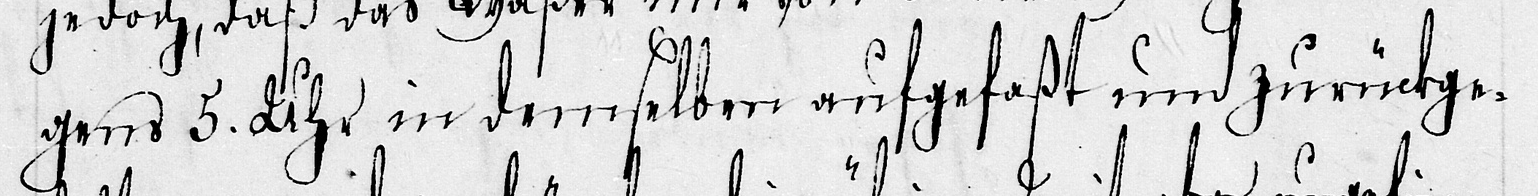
gens 5. Uhr in demselben aufgefaßt und zurückge¬
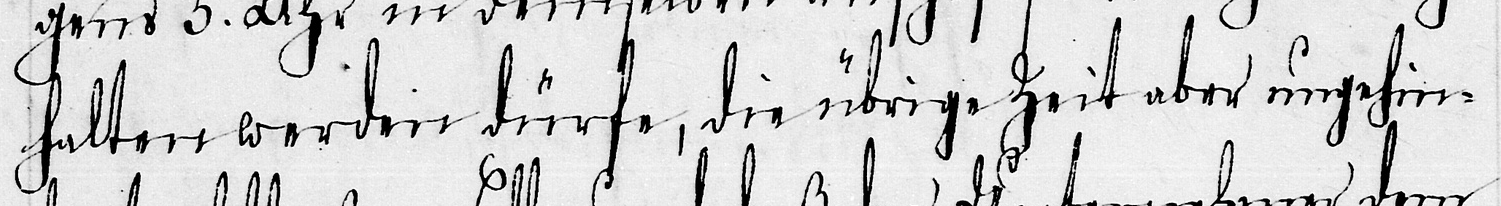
halten werden dürfe, die übrige Zeit aber ungehin¬
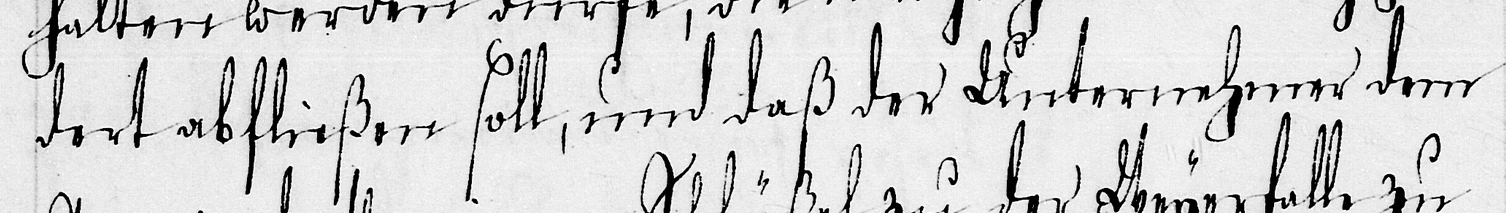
dert abfließen soll, und daß der Unternehmer dem
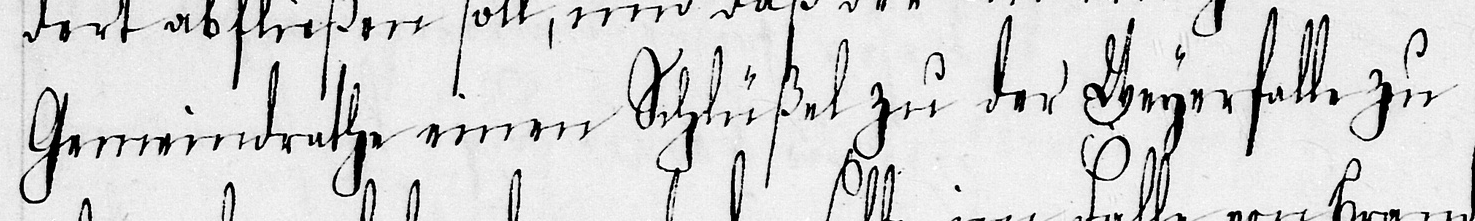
Gemeindrathe einen Schlüßel zu der Weyerfalle zu
